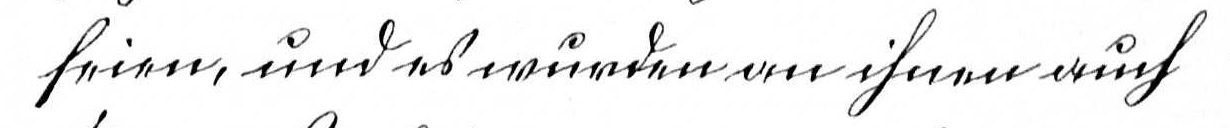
seien, und es wurden an ihnen auch
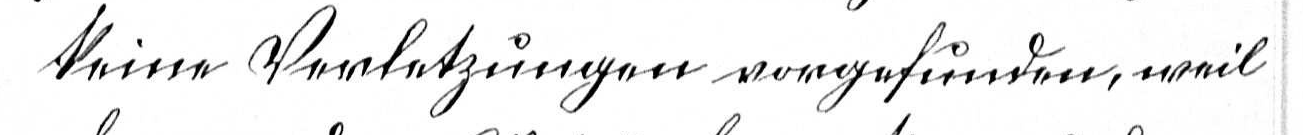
keine Verletzungen vorgefunden, weil
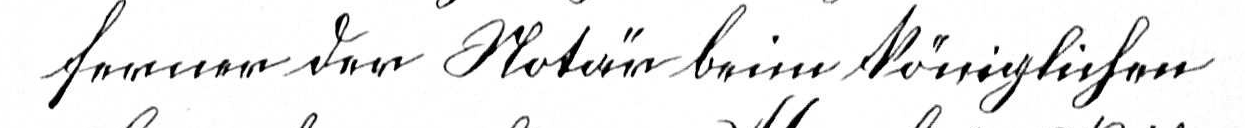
ferner der Notär beim königlichen
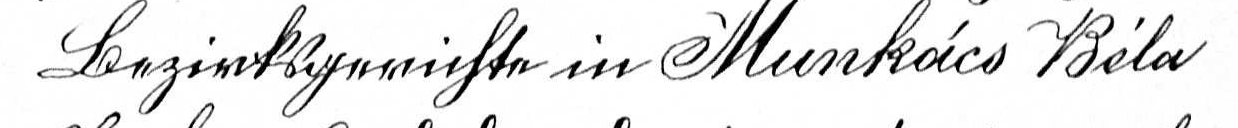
Bezirksgerichte in Munkács Béla
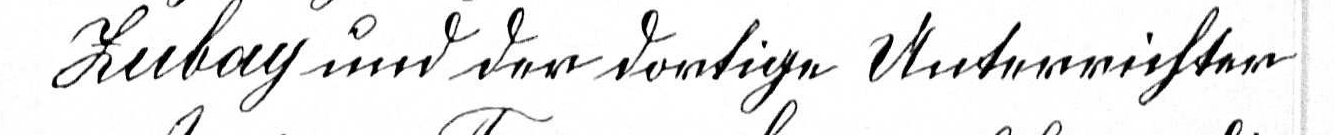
Zubay und der dortige Unterrichter
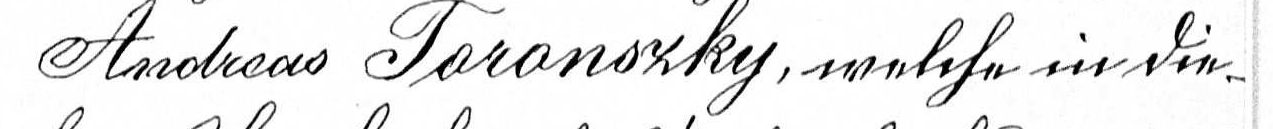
Andreas Toronszky, welche in die¬
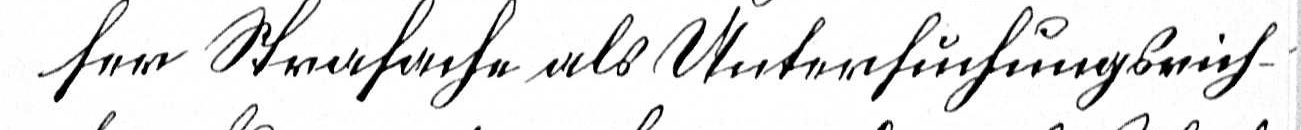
ser Strasache als Untersuchungsrich¬
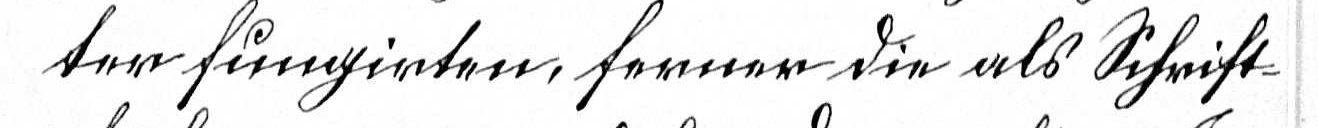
ter fungirten, ferner die als Schrift¬
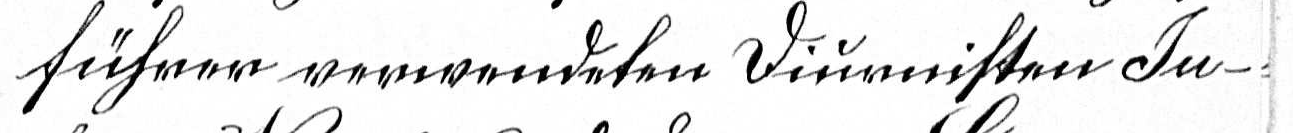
führer verwendeten Diurnisten Ju¬
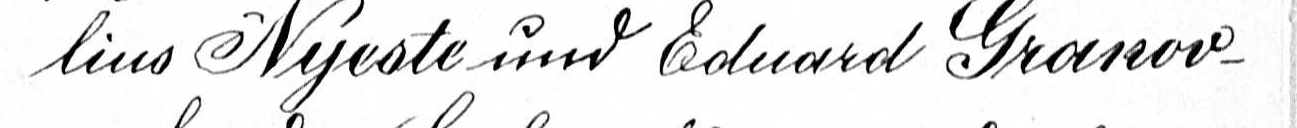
lius Nyeste und Eduard Granov¬
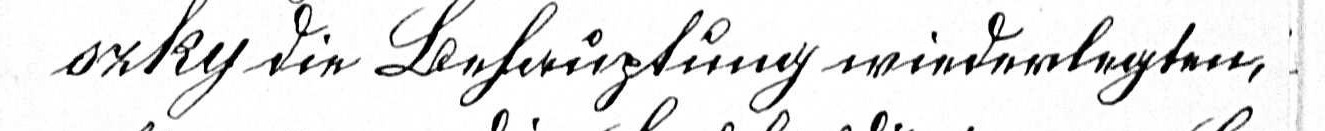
szky die Behauptung wiederlegten,
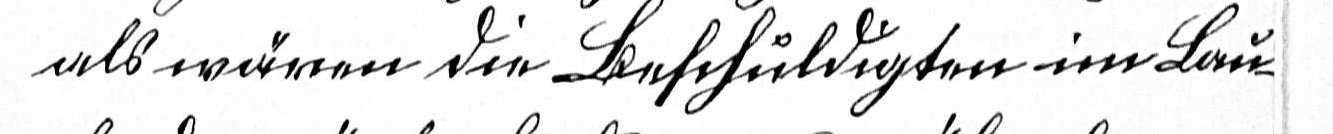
als wären die Beschuldigten im Lau¬
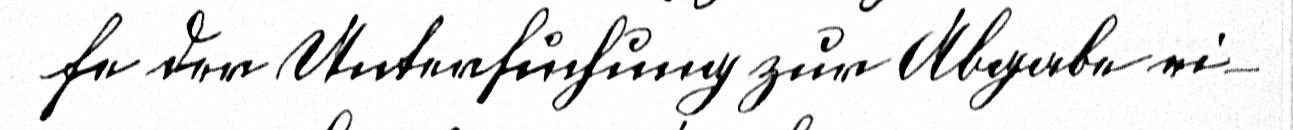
fe der Untersuchung zur Abgabe ei¬
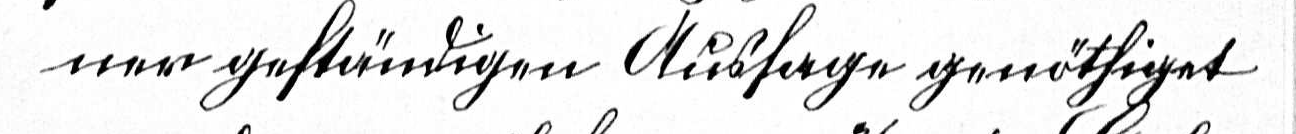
ner geständigen Aussage genöthiget
